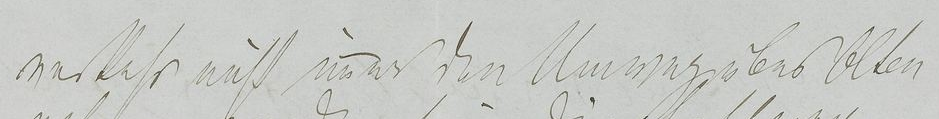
verkehr nicht immer den Umweg über Olten
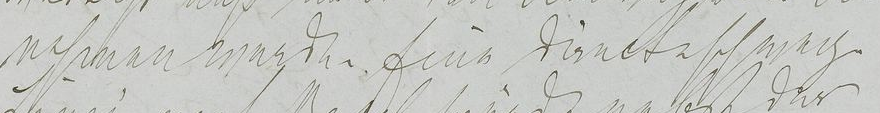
nehmen werde. Eine directe schweiz.
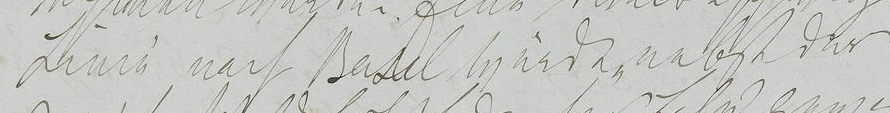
Linie nach Basel würde nebst der
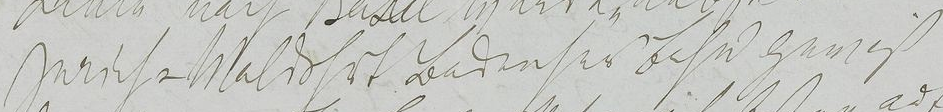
Zürich–WaldshutBadenser Bahn gewiß
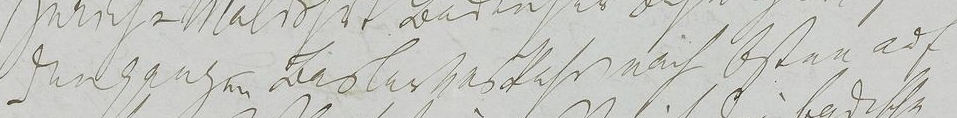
den ganzen Basler Verkehr nach Osten auf-
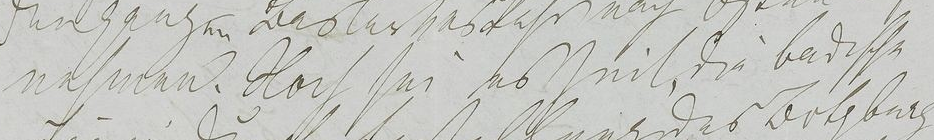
nehmen. Noch sei es Zeit, die badische
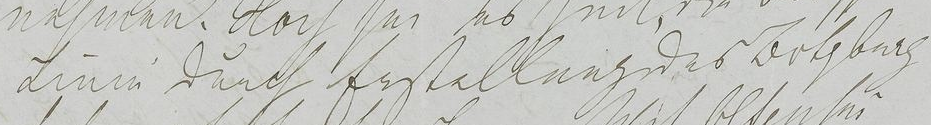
Linie durch Erstellung der Bötzberg -
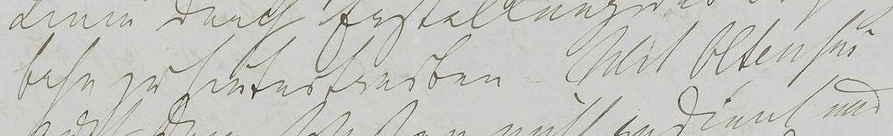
bahn zu hintertreiben. Mit Olten sei
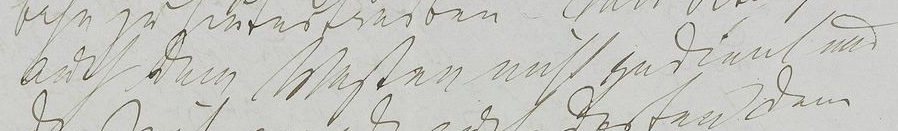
auch dem Westen nicht gedient und
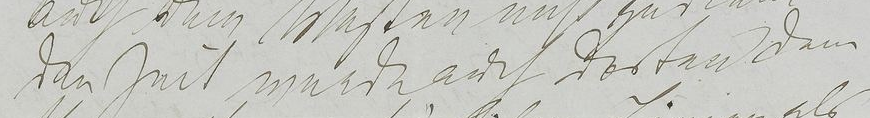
die Zeit werde auch dorten dem
